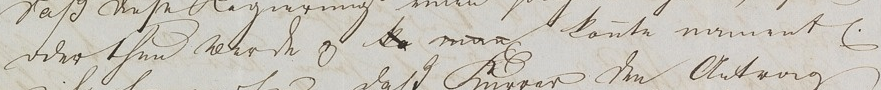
oder thun werde & koman konnte namentl.
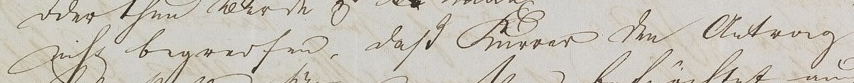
nicht begreifen, daß Furrer den Antrag
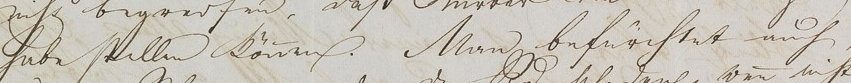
habe stellen können. Man befürchtet auch,
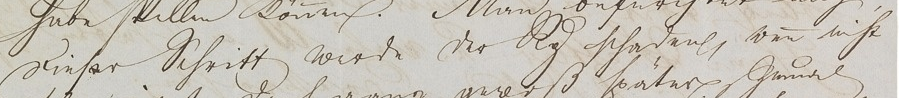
dieser Schritt werde der Rg schaden, wenn nicht
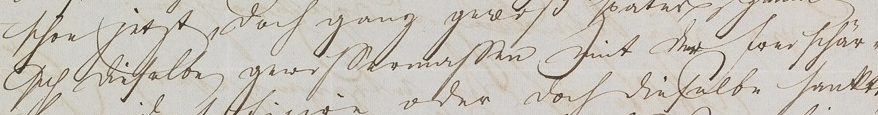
sich dieselbe gewissermaßen mit der Freischär-
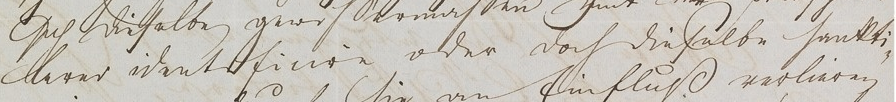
lerei identificire oder doch dieselbe sankti-
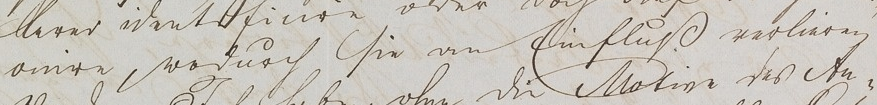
onire, wodurch sie an Einfluß verlieren
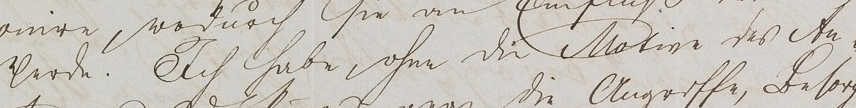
werde. Ich habe, ohne die Motive des An-
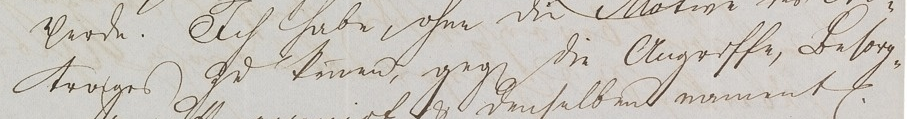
trages zu kennen, gegen die Angriffe, Besorg-
